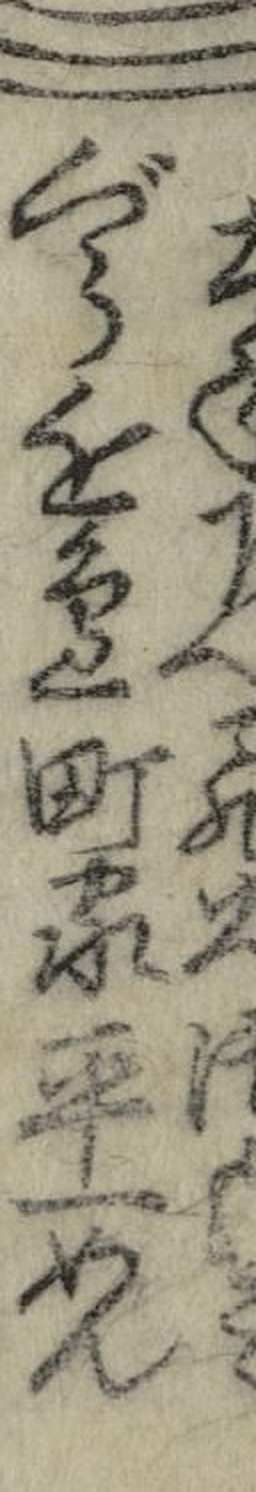ぐら近辺町家平一めん
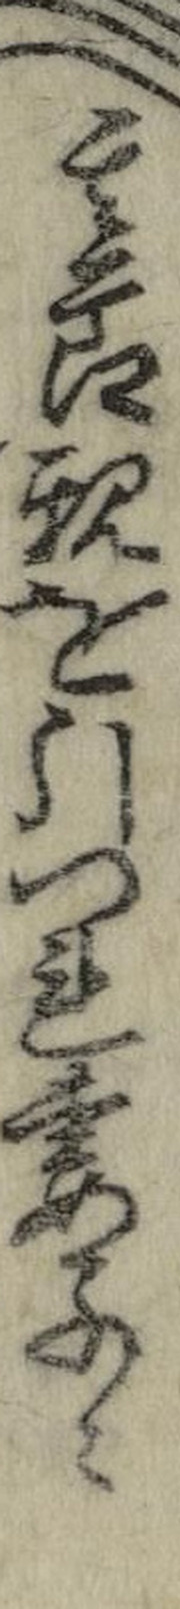其節親を引つれ妻子に
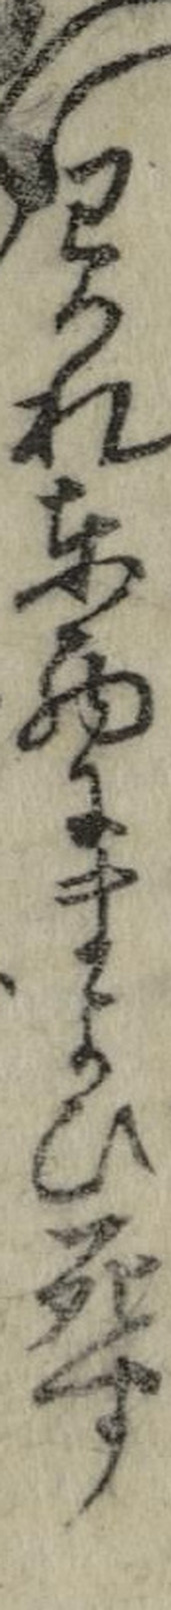わかれ東西さまよひ死す
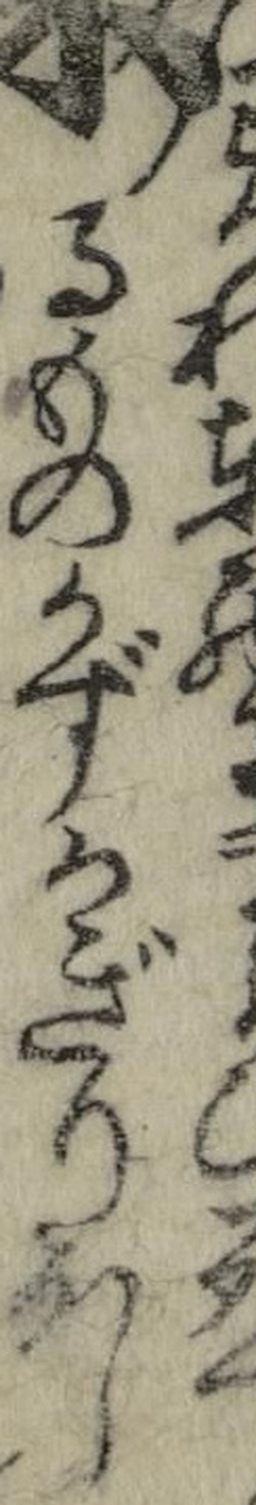るものかずかぎりなし
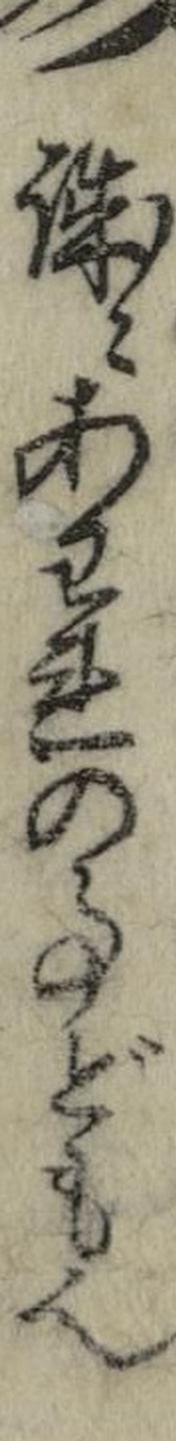誠にあわれの事ども也
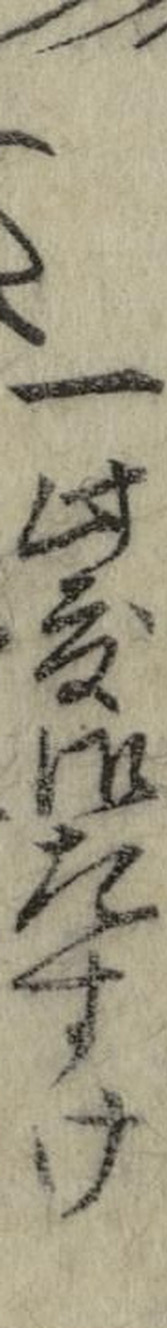一此度御たすけ
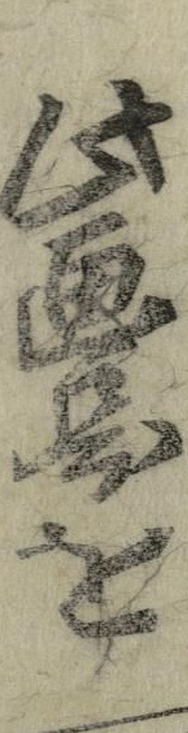此画圖を
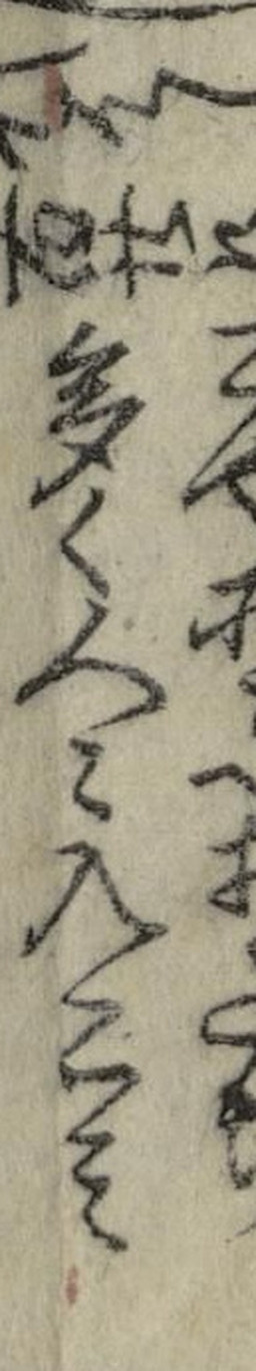多く人々入こみ
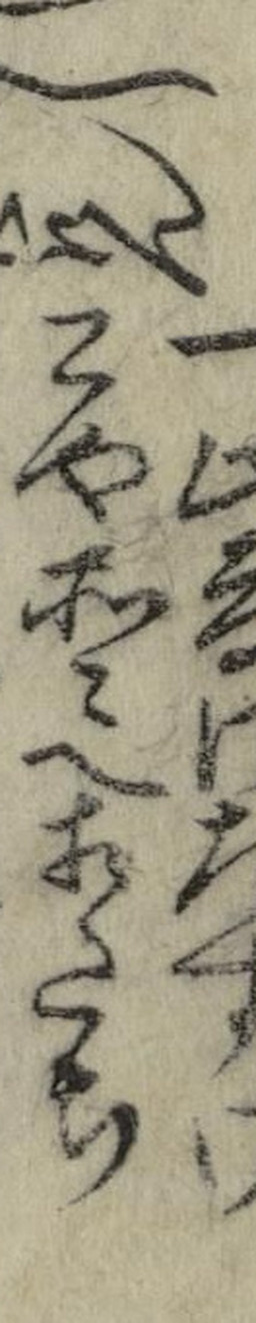こや所々へおたち
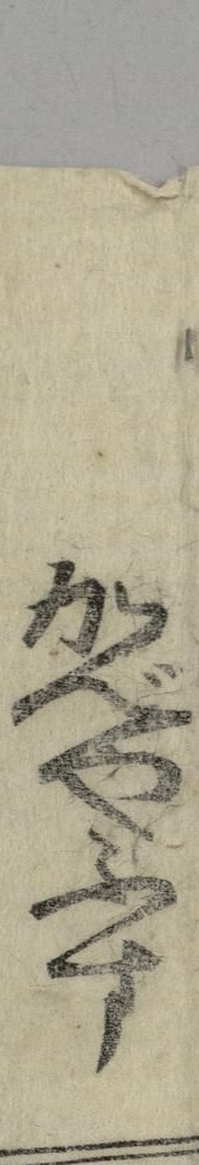かべやふす
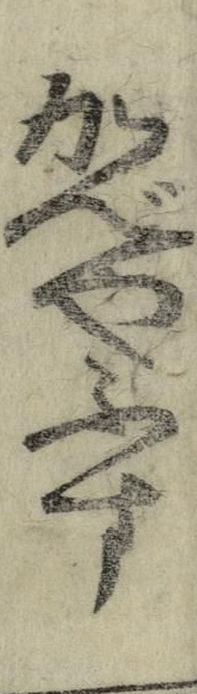かべやふす
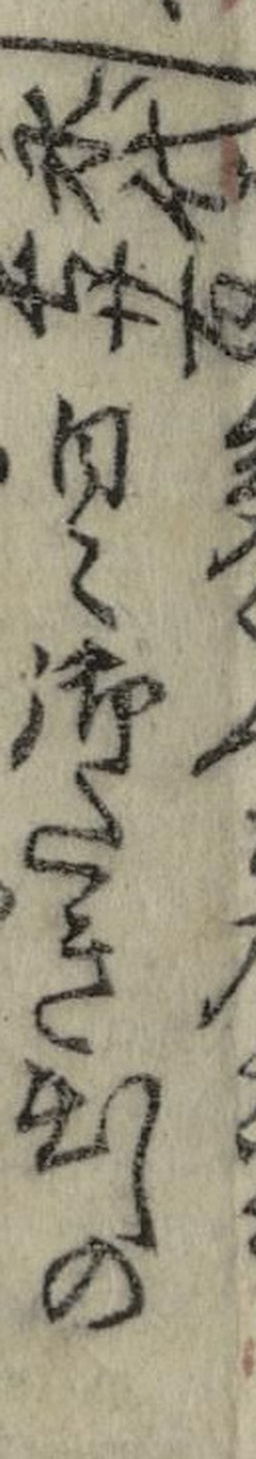日々御たき出しの
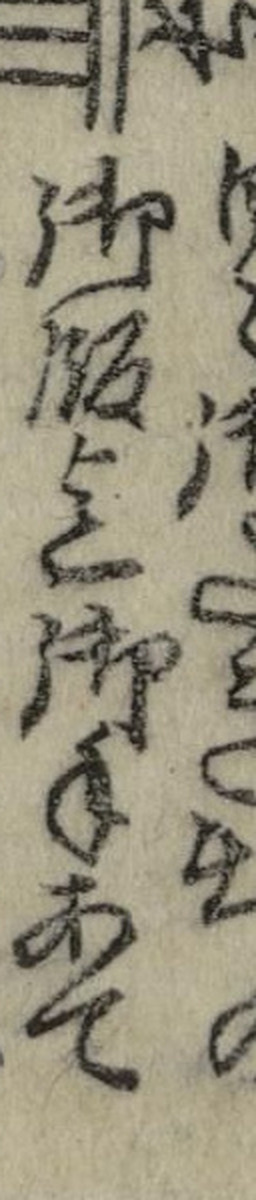御飯迄御手あて
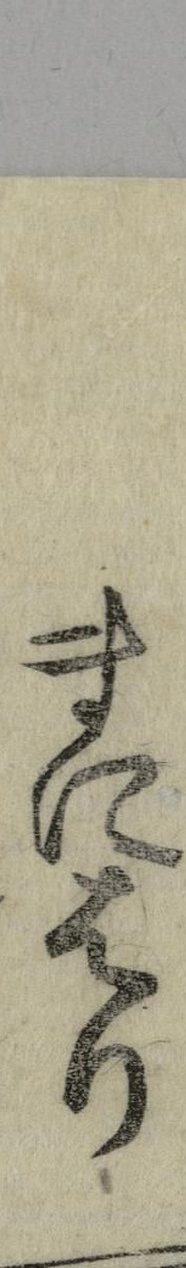まにはり
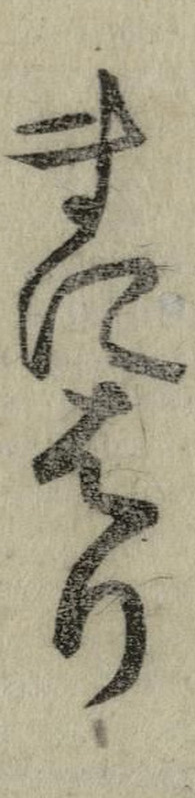まにはり
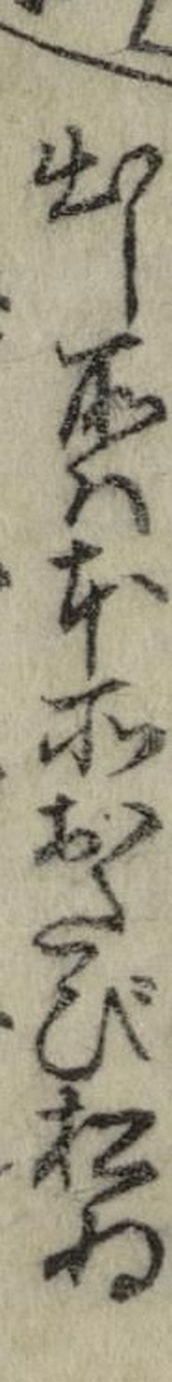出しは本所おたびおゐ
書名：[文政十二年三月の江戸大火に関する瓦版]
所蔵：東京大学地震研究所図書室 Earthquake Research Institute Library, The University of Tokyo, JAPAN
